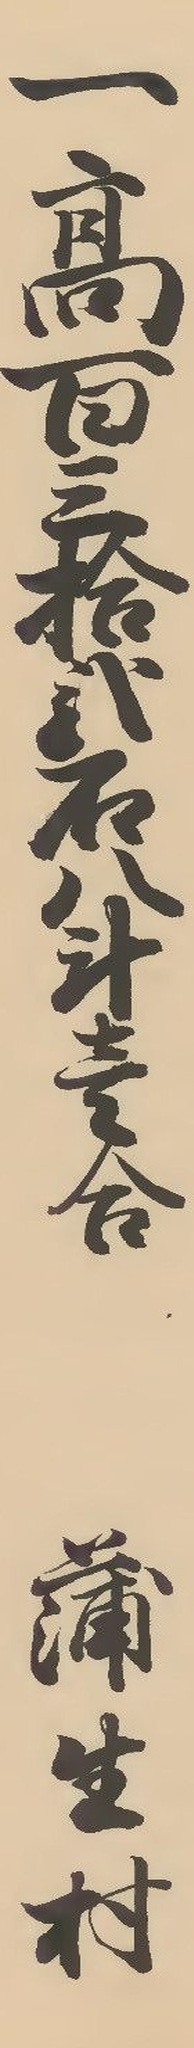一高百三拾弐石八斗壱合蒲生村

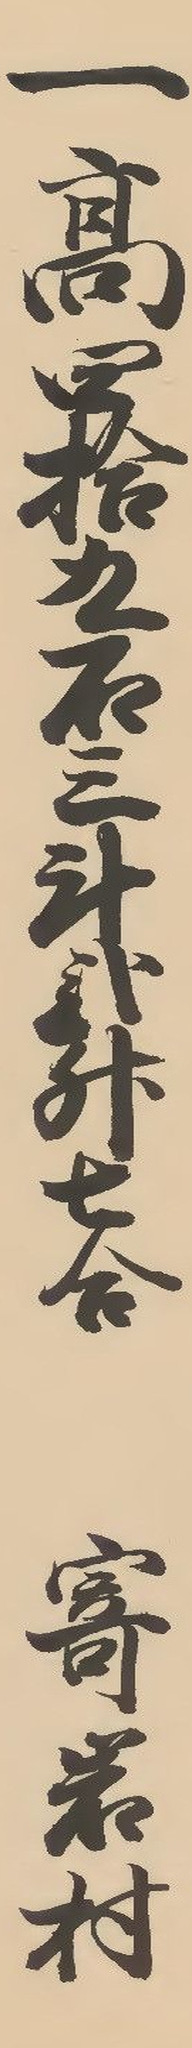一高四拾九石三斗弐升七合寄岩村
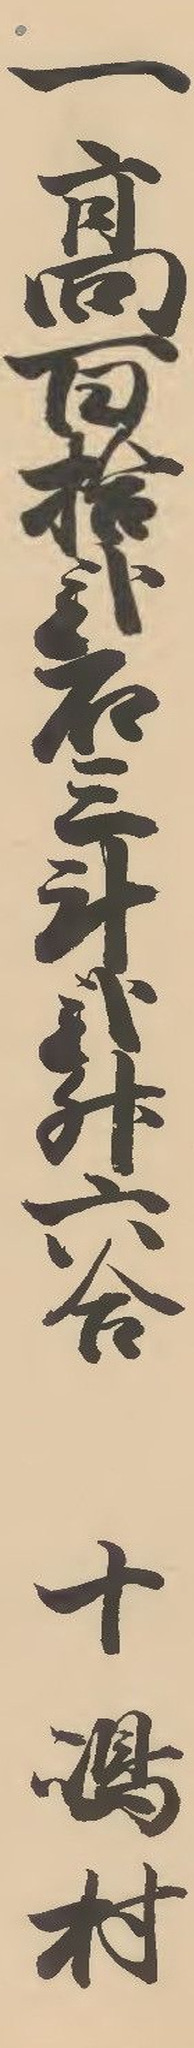一高百拾弐石三斗弐升六合十島村
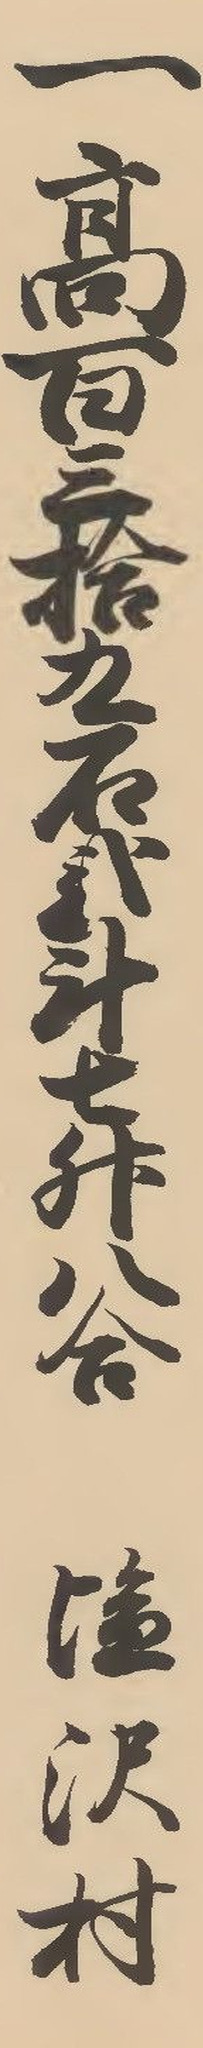一高百三拾九石弐斗七升八合塩沢村
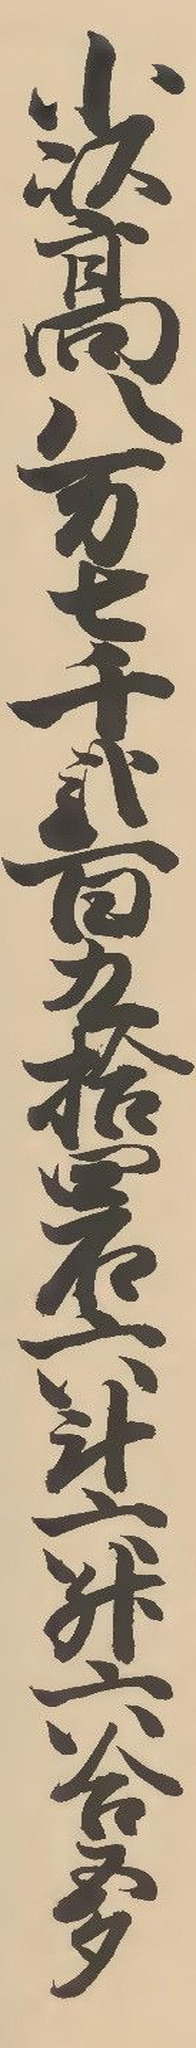小以高八万七千弐百九拾四石六斗六升六合五勺

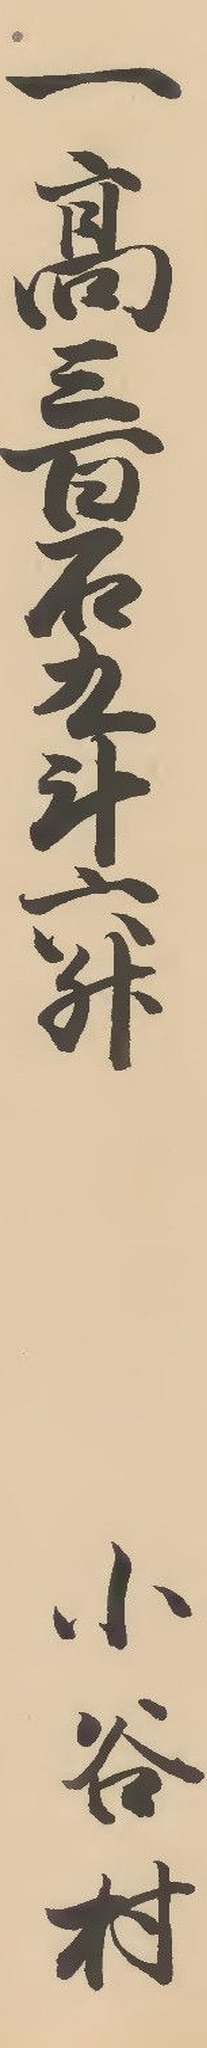一高三百石九斗六升小谷村
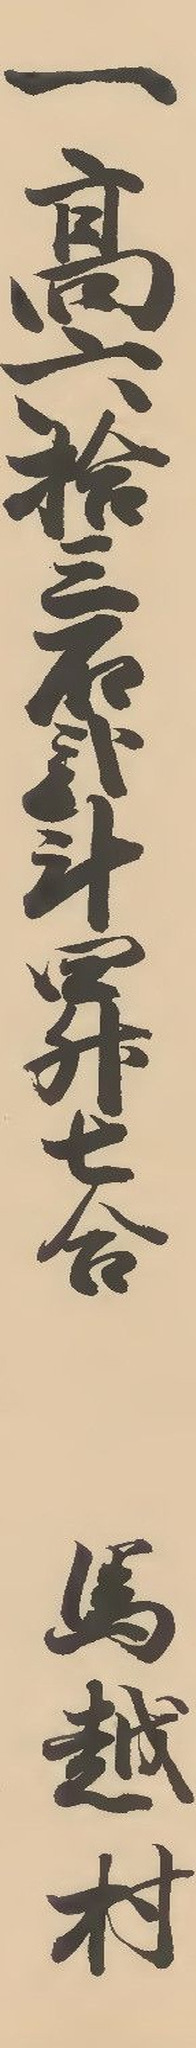一高六拾三石弐斗四升七合馬越村
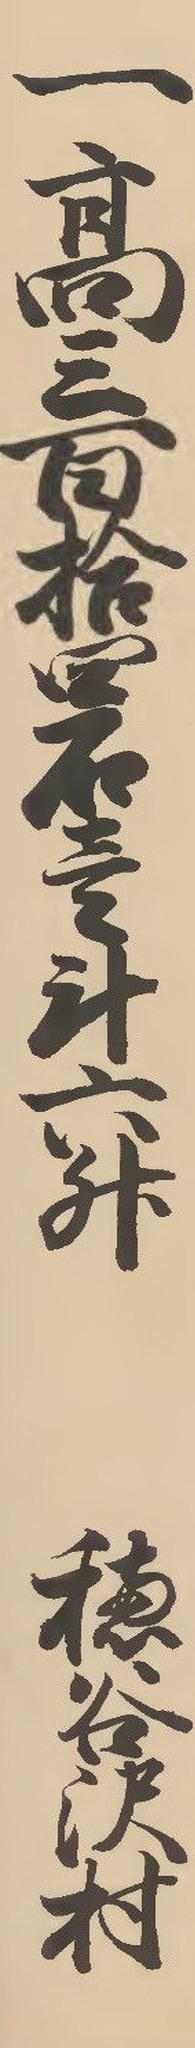一高三百拾四石壱斗六升穂谷沢村
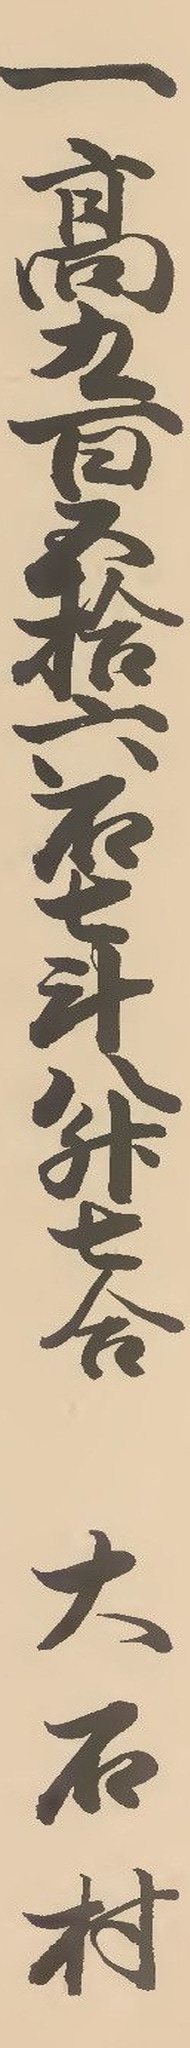一高九百五拾六石七斗八升七合大石村
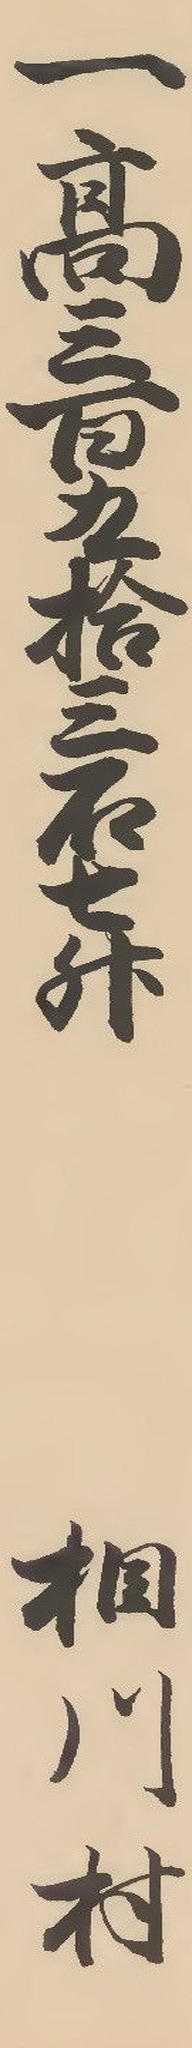一高三百九拾三石七升相川村
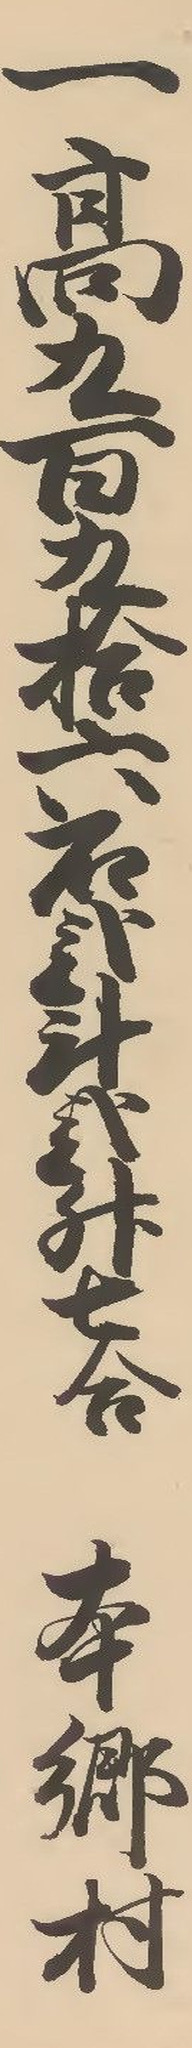一高九百九拾六石弐斗弐升七合本郷村
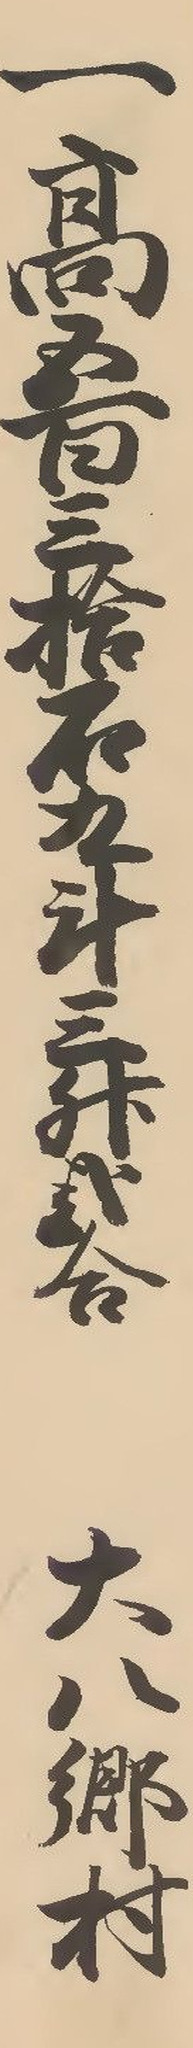一高五百三拾石九斗三升弐合大八郷村

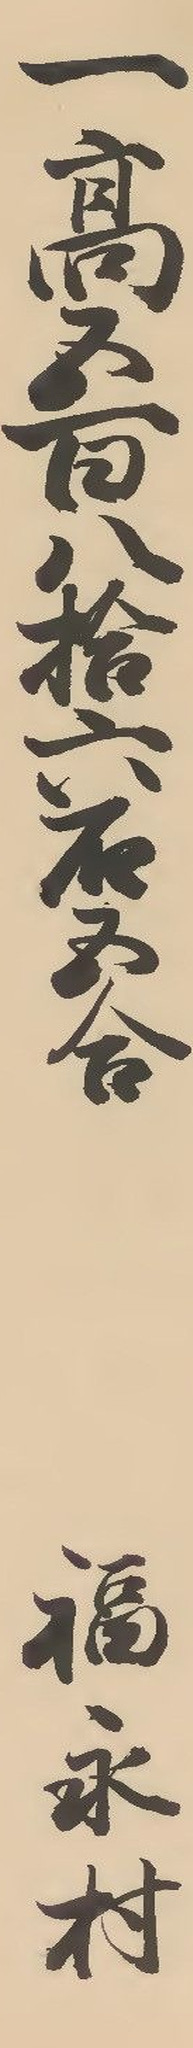一高五百八拾六石五合福永村
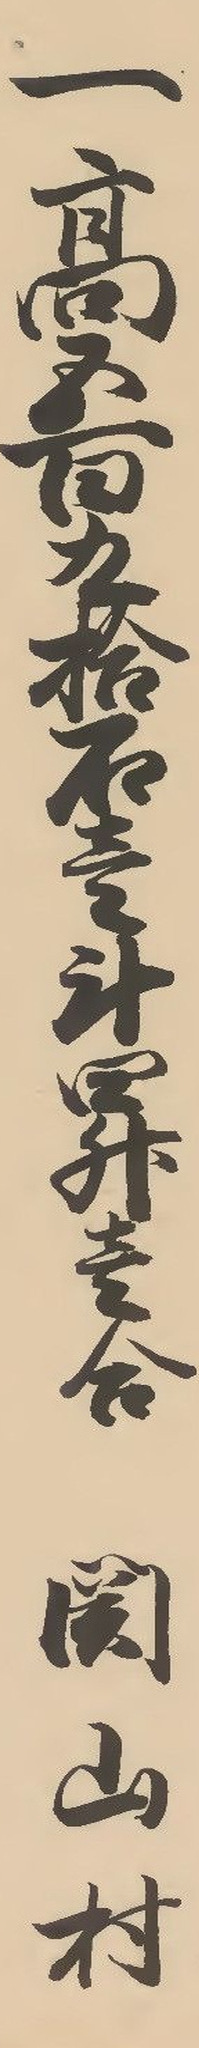一高五百九拾石壱斗四升壱合関山村
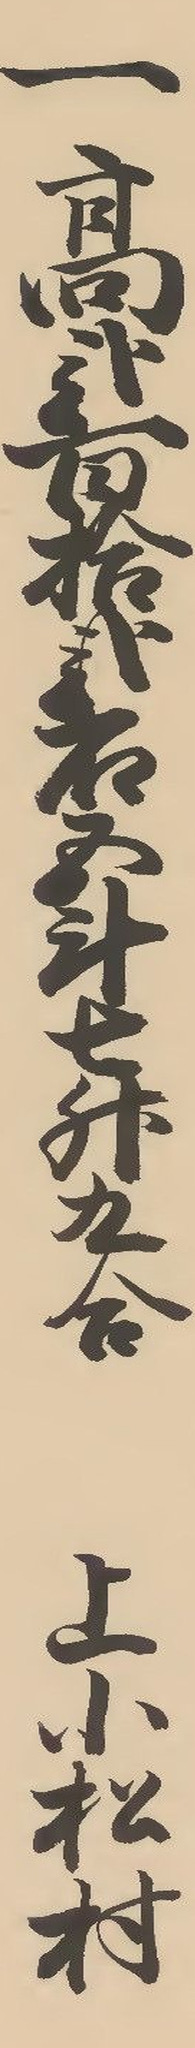一高弐百拾弐石五斗七升九合上小松村
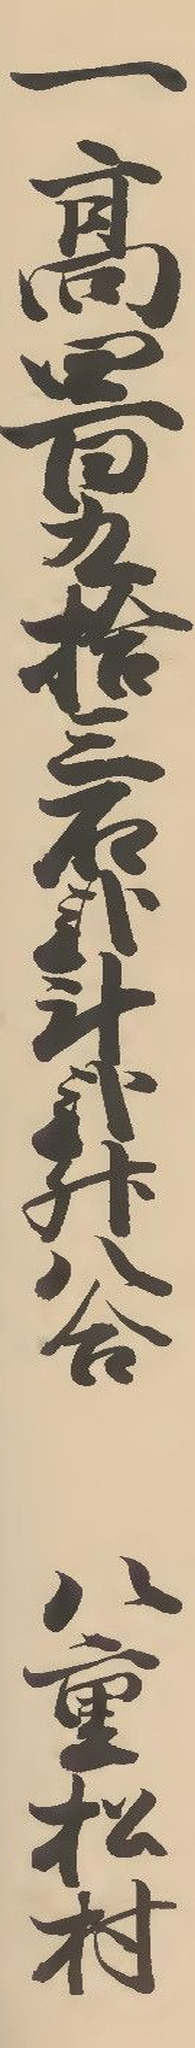一高四百九拾三石弐斗弐升八合八重松村
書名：陸奥国郷帳　１
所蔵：国立公文書館 National Archives of Japan
